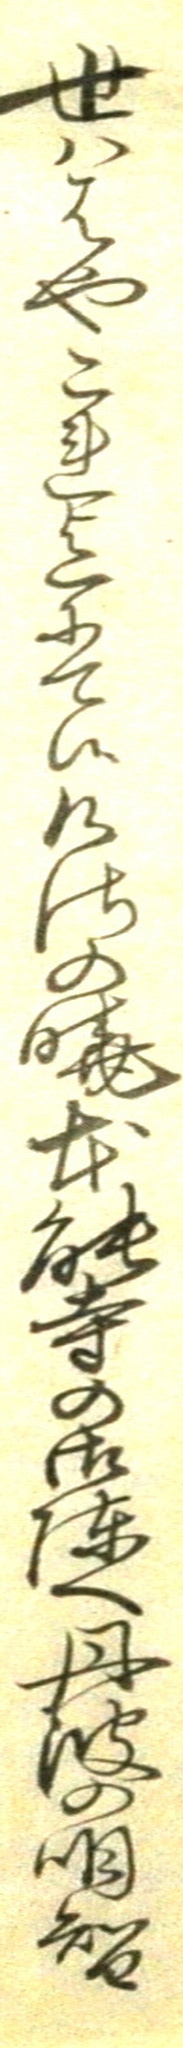世ははやこれ迄にて候けさの暁本能寺の御陣へ丹波の明智
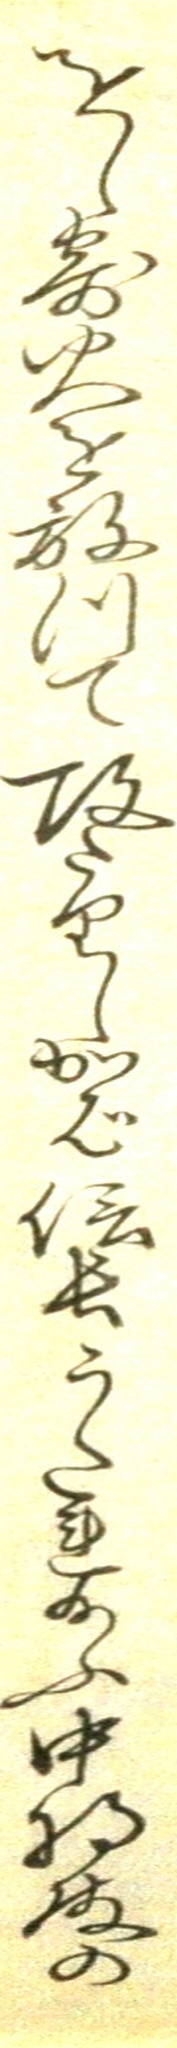をし寄火を放つて攻たりしかば信長うたれ給ふ中将殿の
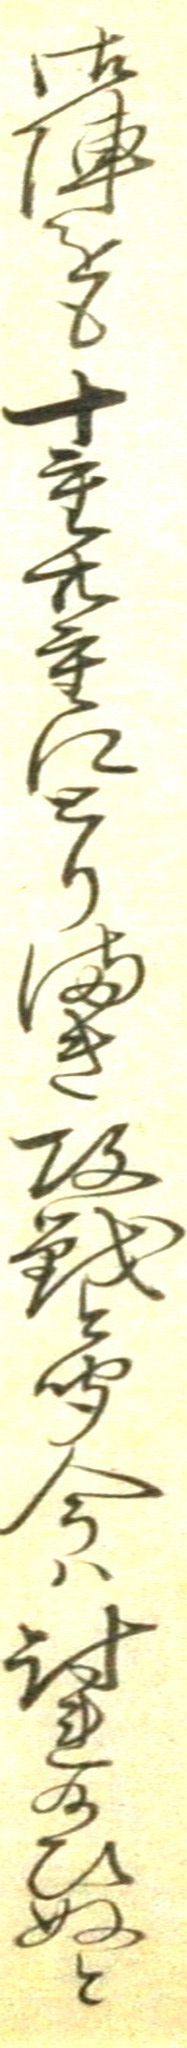御陣をも十重廿重にとりまき攻戦と聞今は討れ給ひぬと
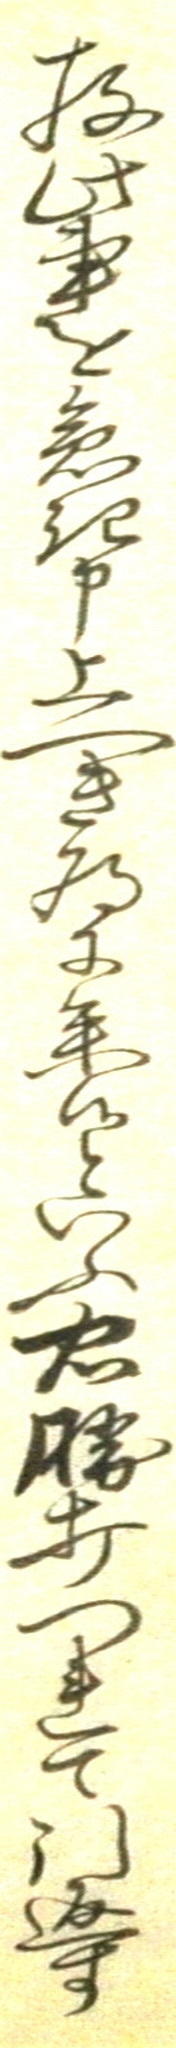存此事を急き申上へき為に参候といふ忠勝打つれて引返す
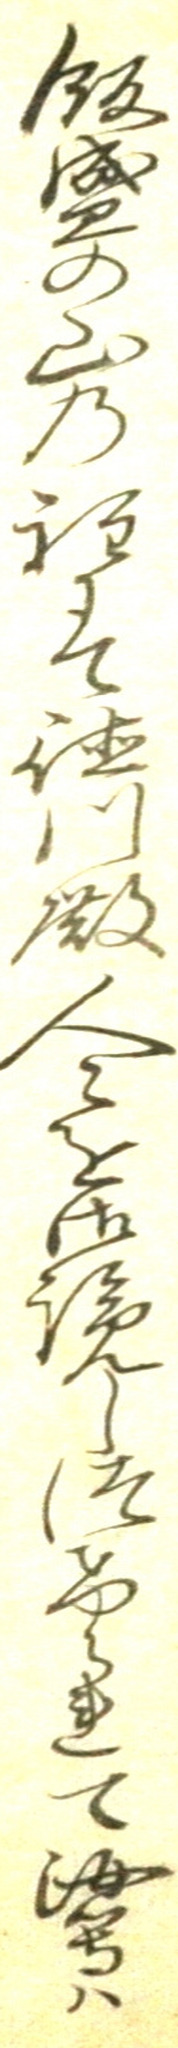飯盛の山の程にて徳川殿人々を御覧しつけられて汝等は
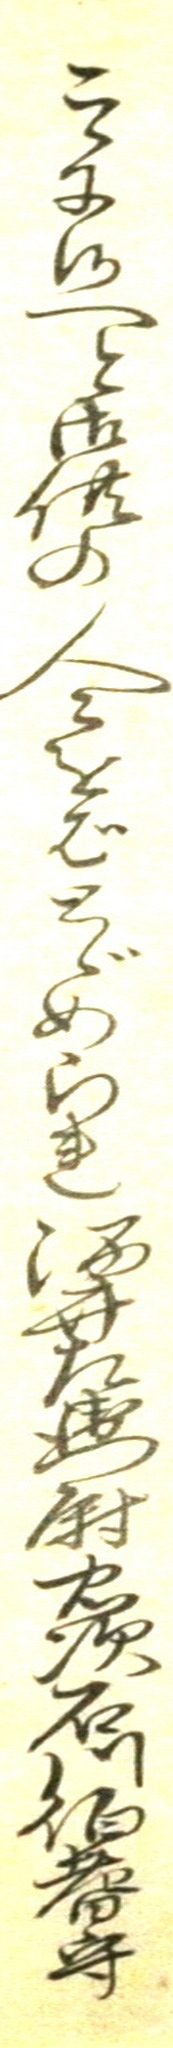こゝに候へと御供の人々をばとゞめられ酒井左衛門尉忠次石川伯耆守
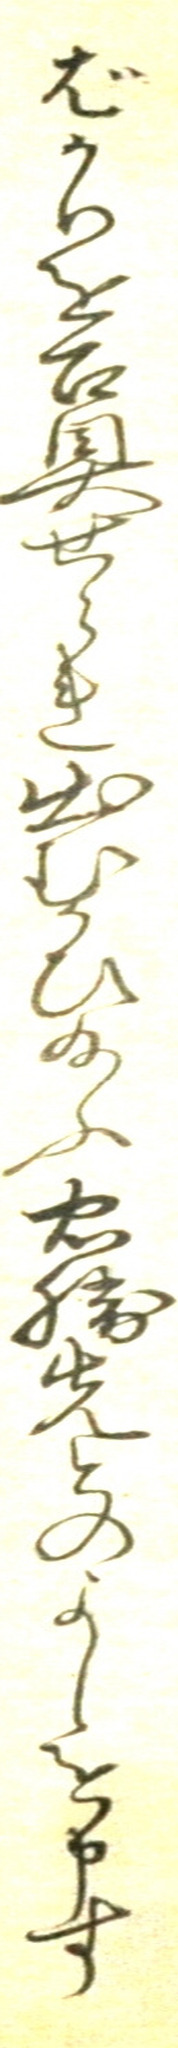ばかりを召具せられ出むかひ給ふ忠勝先とのよしを申す
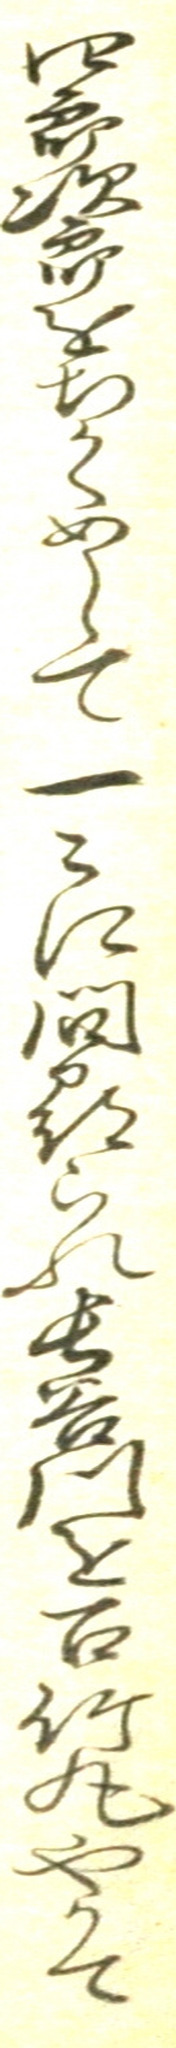四郎次郎をちかくめして一々に問尋られ長谷川を召竹丸やかて
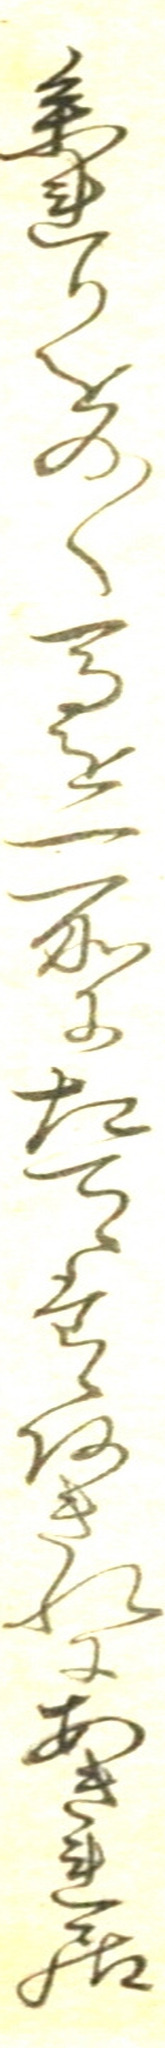参れりをの〳〵馬を一所にたてゝたゝあきれにあきれ居
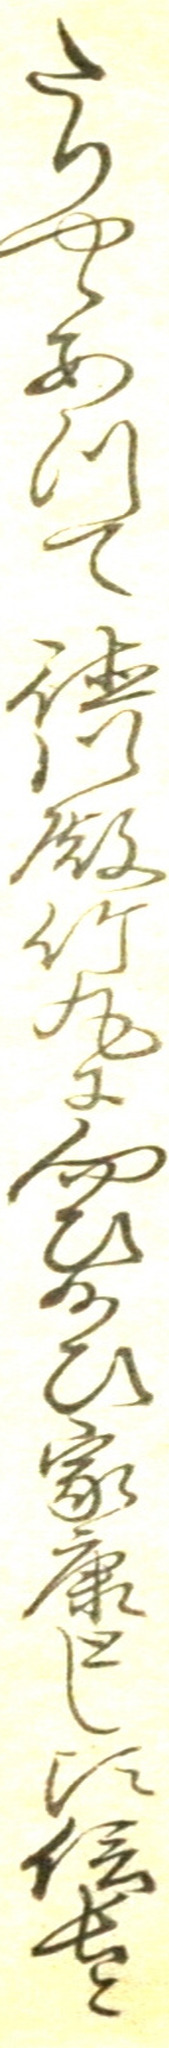たりやゝあつて徳川殿竹丸に向ひ給ひ家康とし頃信長と
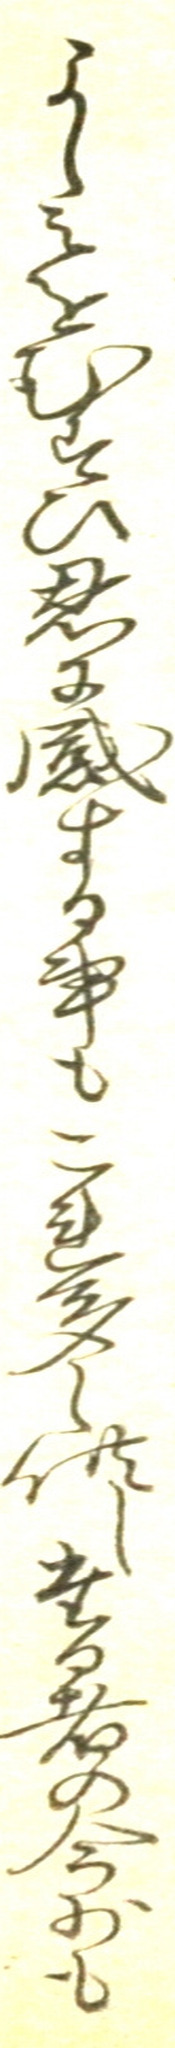よしみをむすひ恩に感する事もこれ多し供したる者の今少も
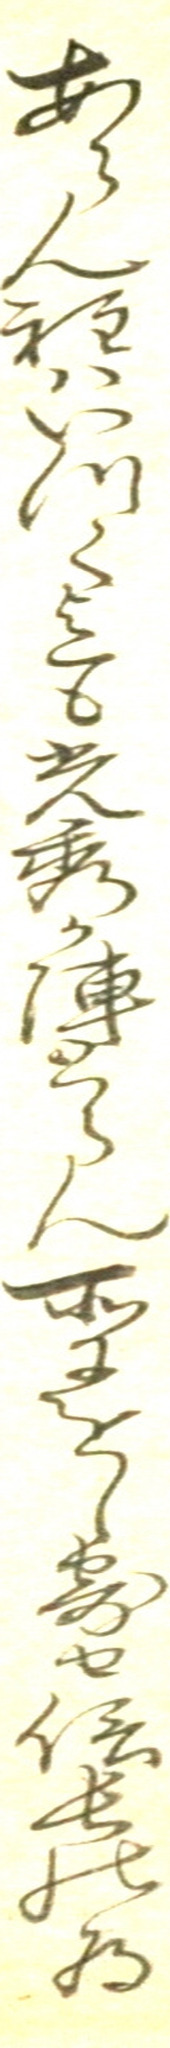あらん程はいつく迄も光秀か陣とらん所にをし寄せ信長の為
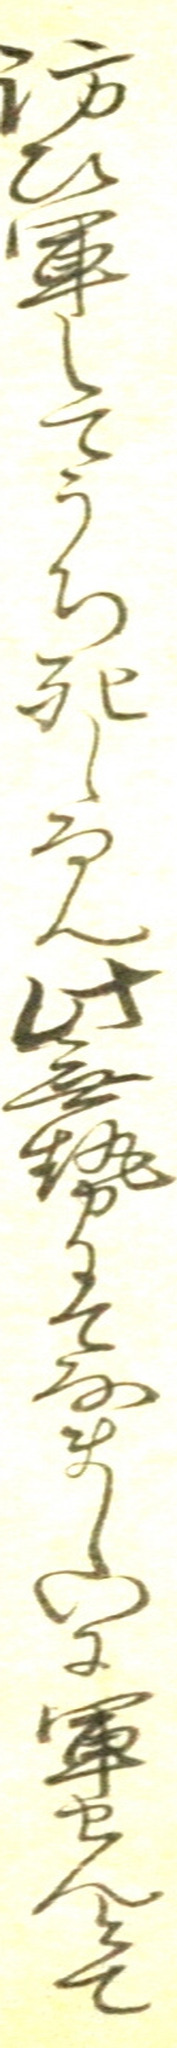訪ひ軍してうち死しなん此無勢にてなましいに軍せんとて
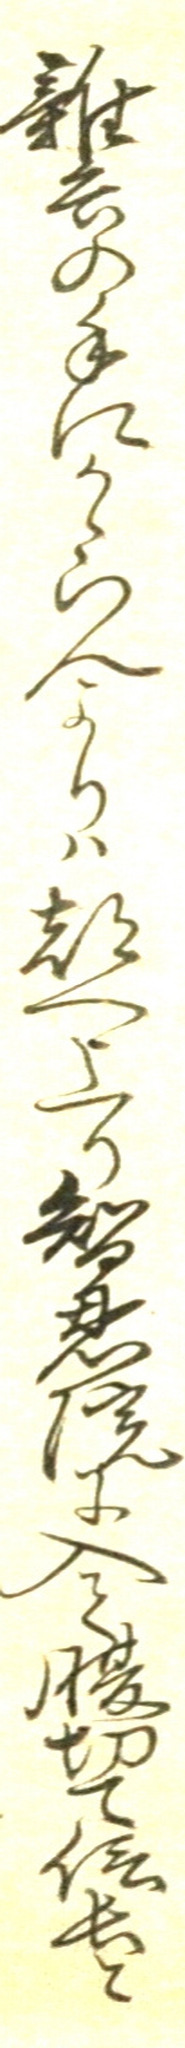雑兵の手にかゝらんよりは都へ上り智恩院に入て腹切て信長と
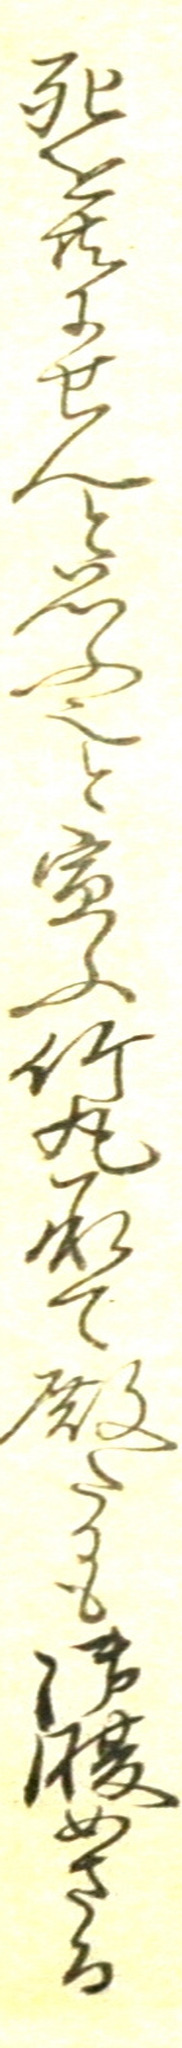死を共にせんと思ふ也と宣ふ竹丸承て殿たにも御腹めさる
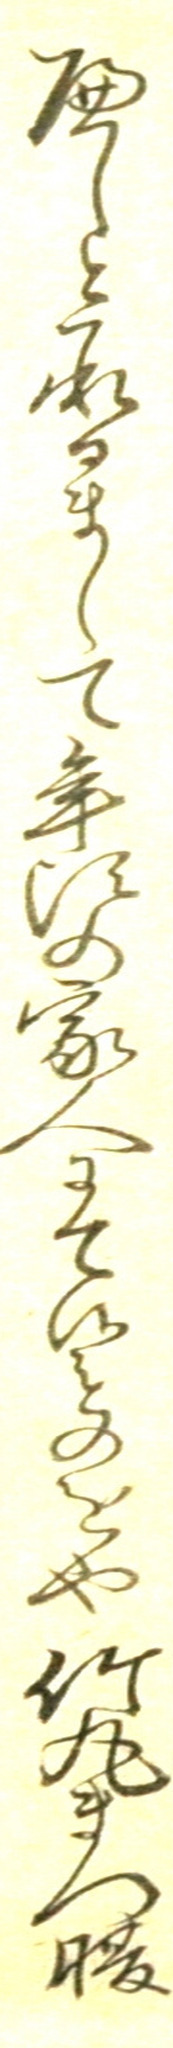へしと承るまして年頃の家人にて候ものをや竹丸まつ腹
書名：藩翰譜（四・上）
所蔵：伊那市立高遠町図書館・合同会社AMANE
